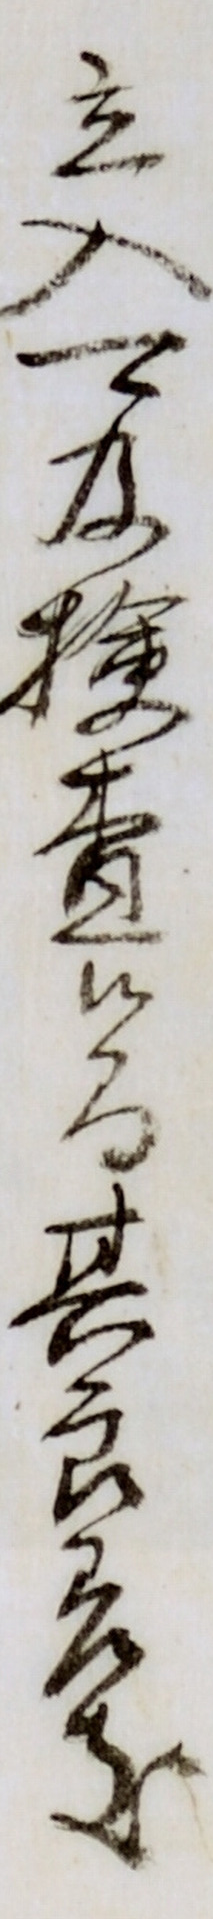立入可及検査候間其節差支
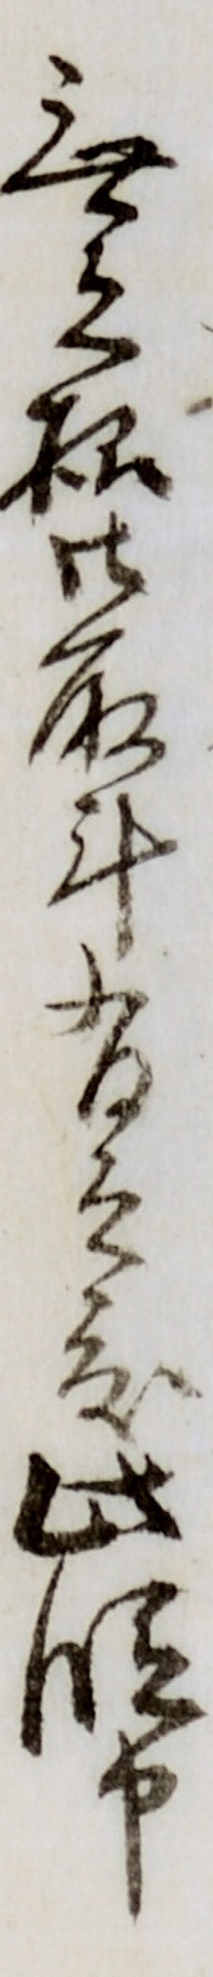無之様御取計有之度此段申
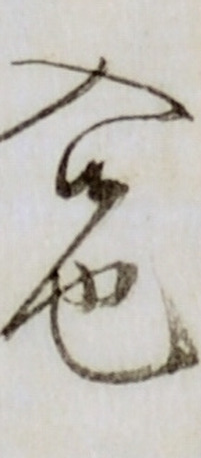入候也
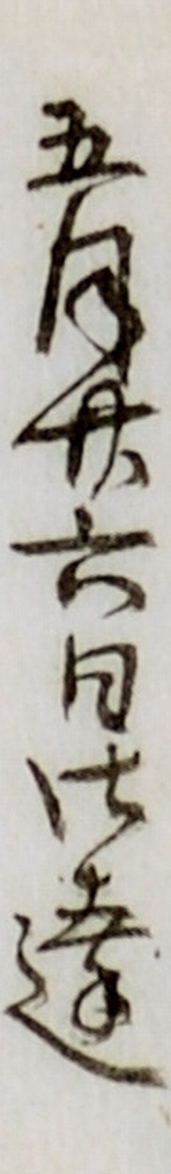五月廿六日御達
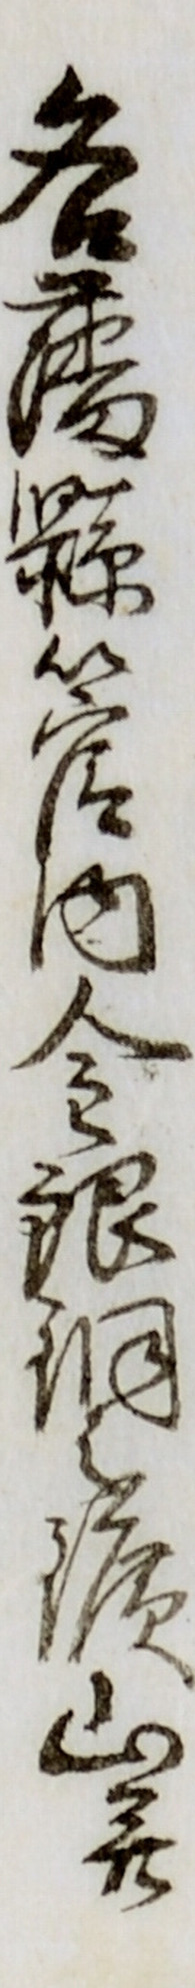各藩県管内金銀銅之鉱山幷
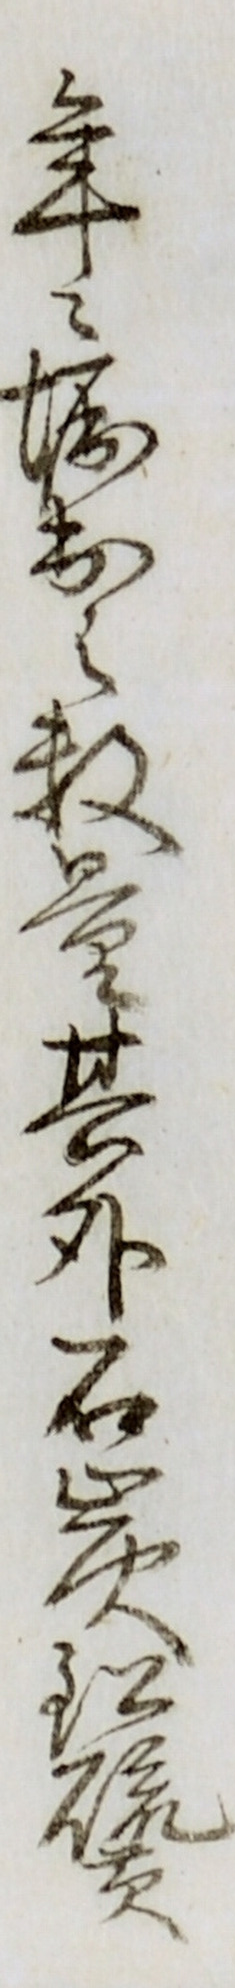年々堀出之数量其外石炭鉛硫黄
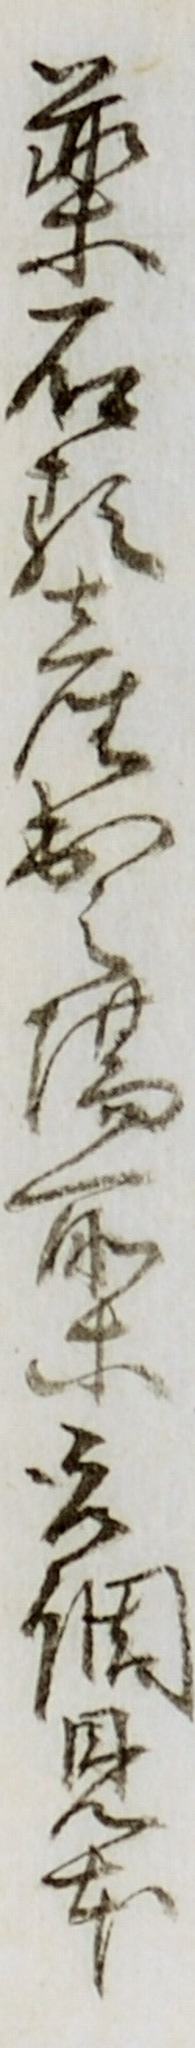薬石類産出之場所等取調見本
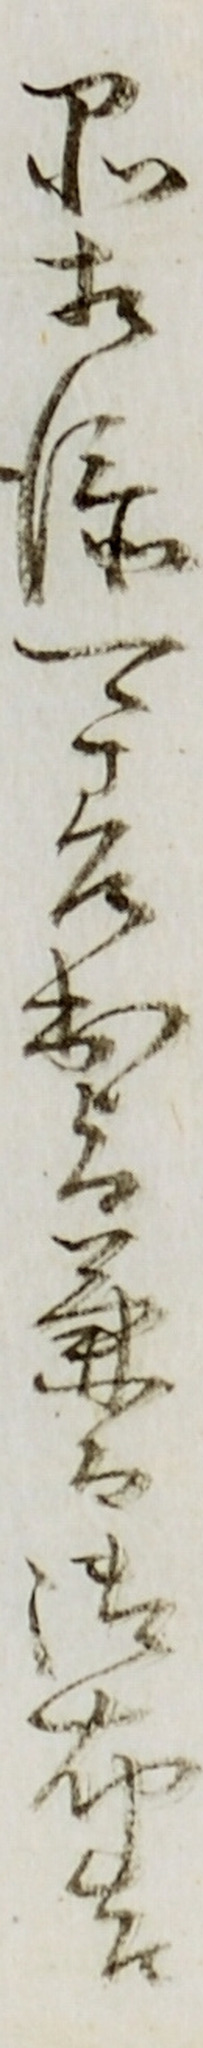品相添可差出旨兼て御布告
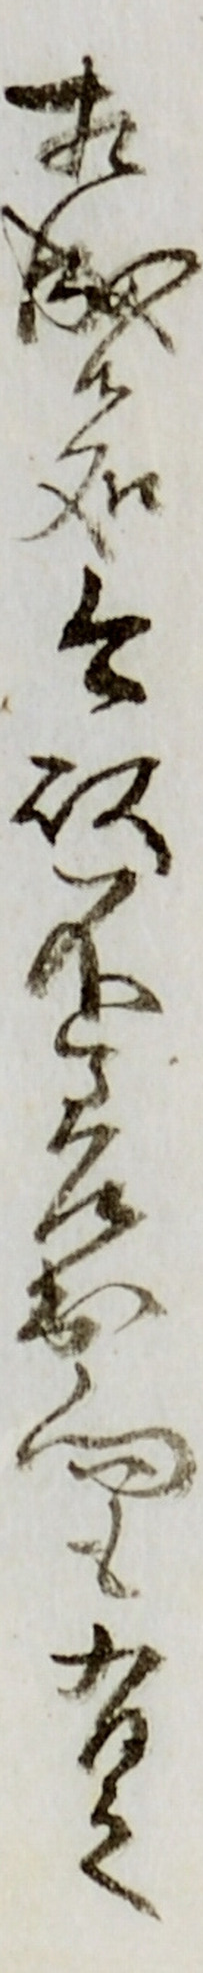相成候処今以不差出向も有之
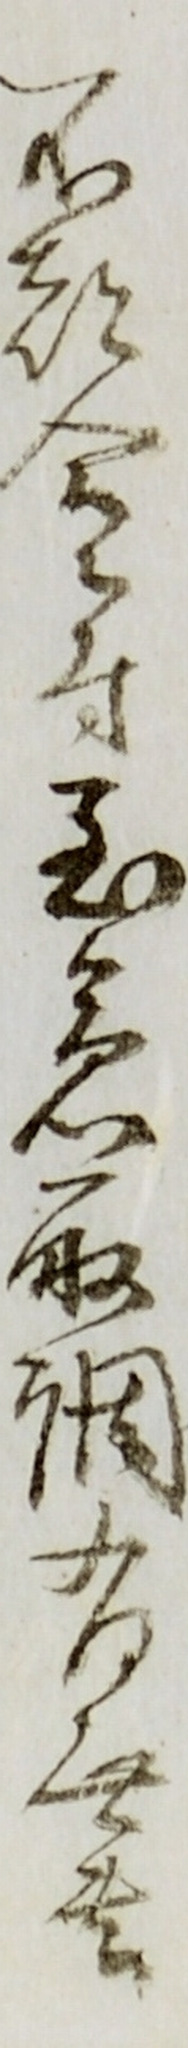不都合に付至急取調有無共
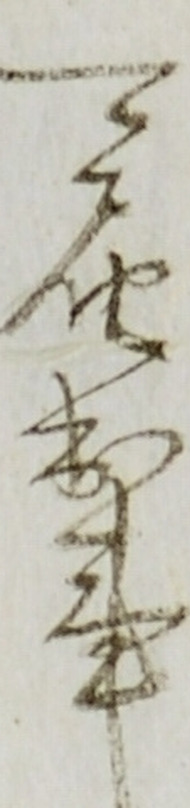可届出事
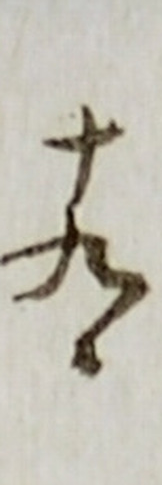十九日
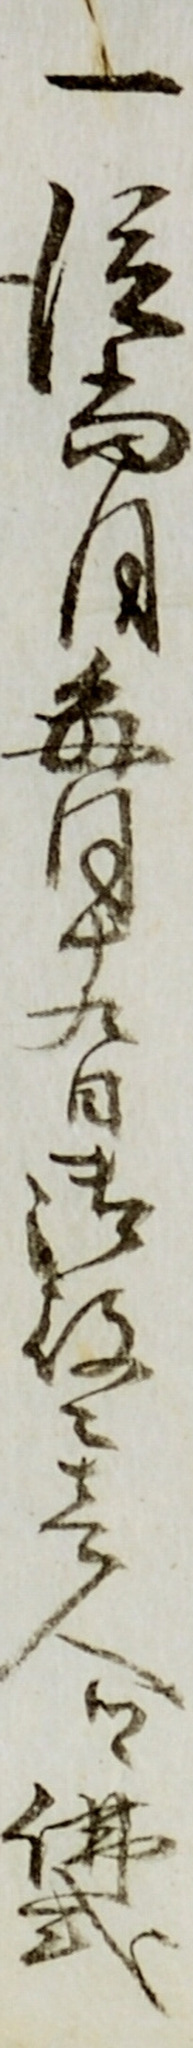一従当月毎月十九日御役々壱人ツヽ仏式
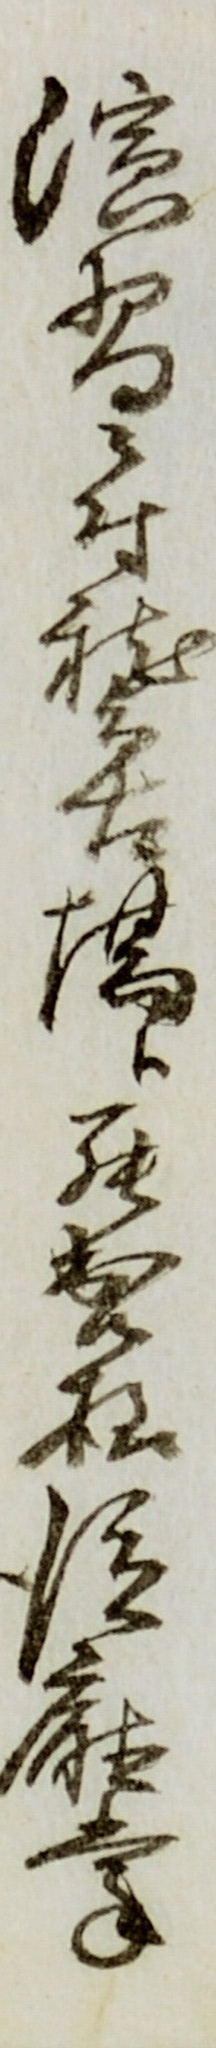演習に付稽古場え罷出候様従庁掌
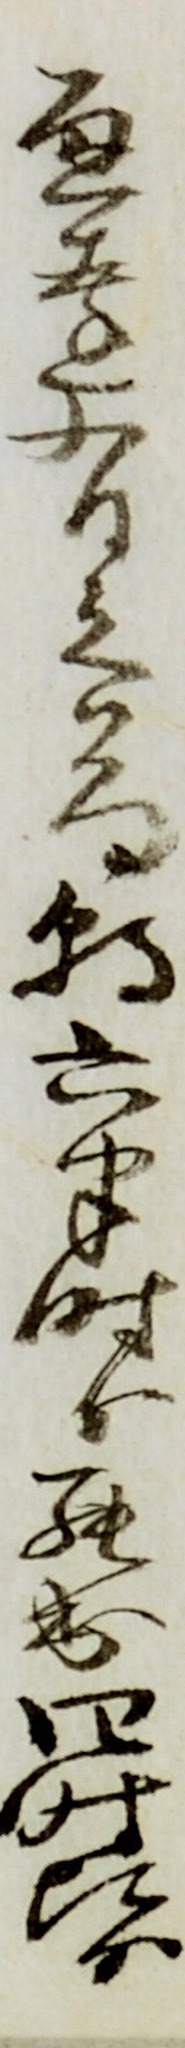通達有之候間朝六半時ゟ罷出四時頃ゟ
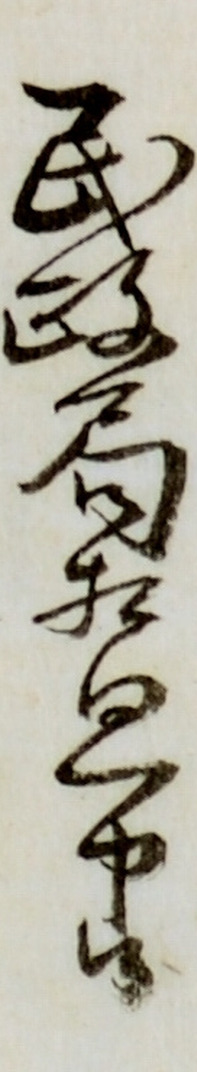民政局相廻申候
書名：山林方諸事御用留
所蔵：伊那市立高遠町図書館・合同会社AMANE
